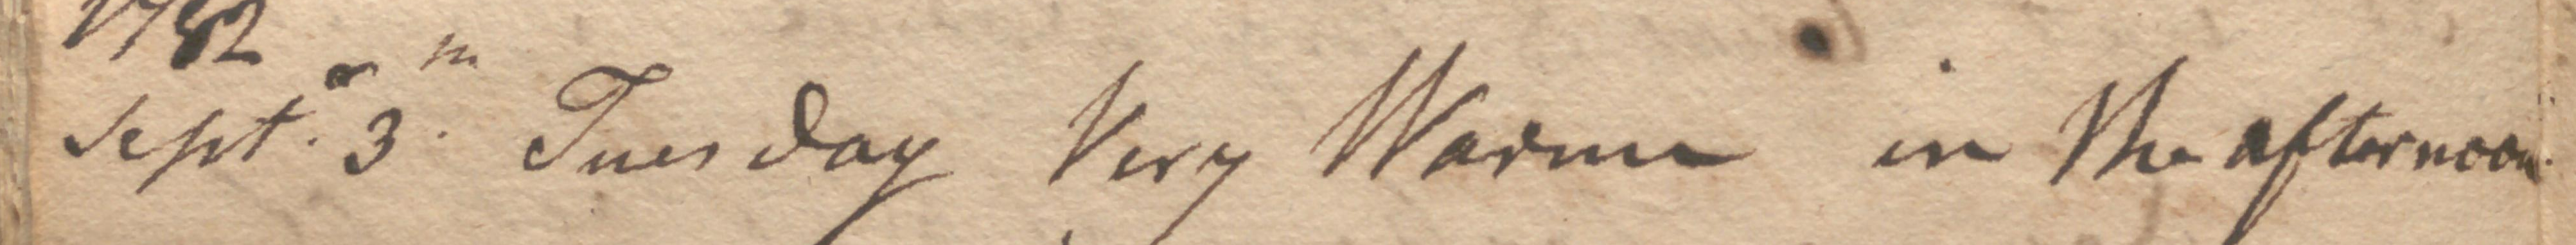Sept^r. 3^th. Tuesday Very Warme in the afternoon
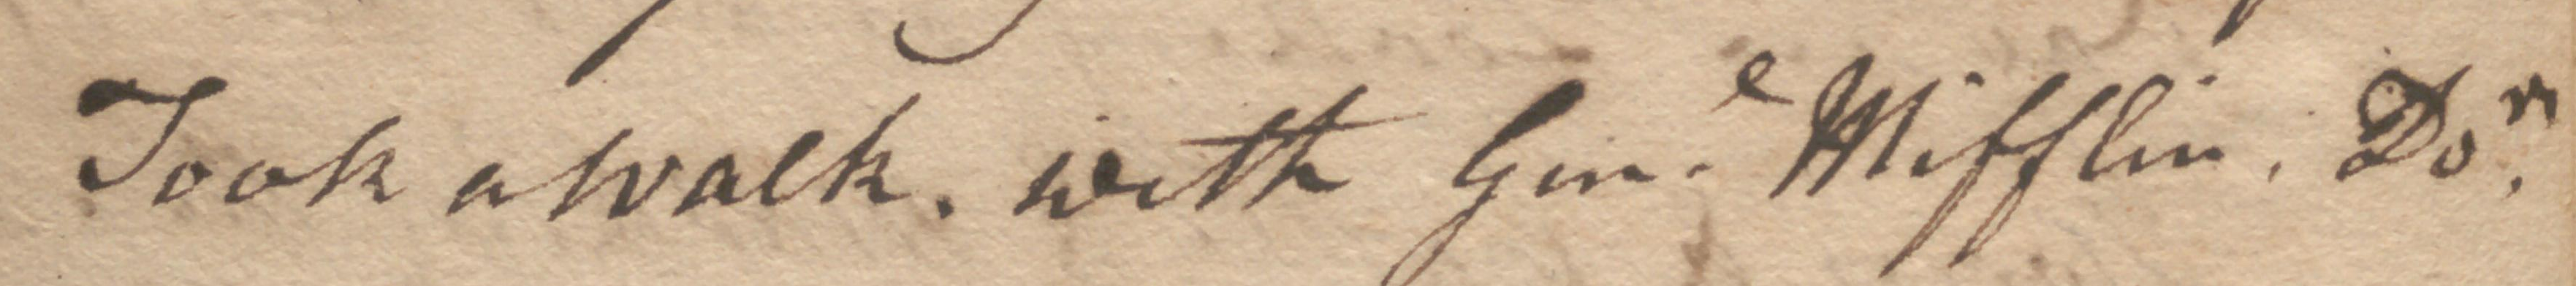Took a walk. with Gen^l. Mifflin. Do^r.
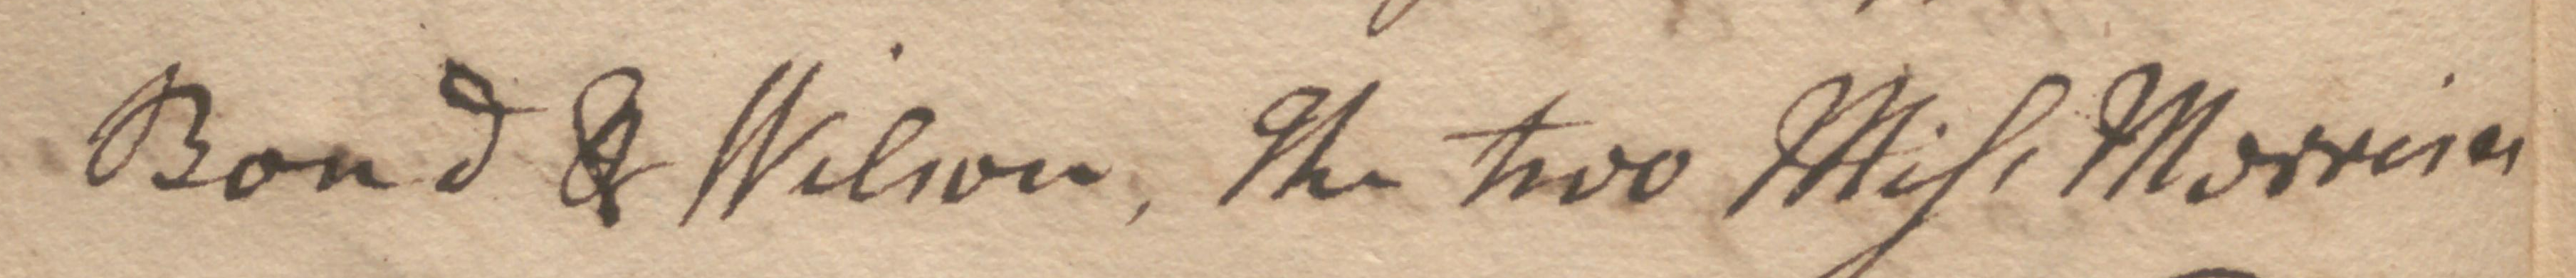Bond & Wilson, The two Miss Morrises
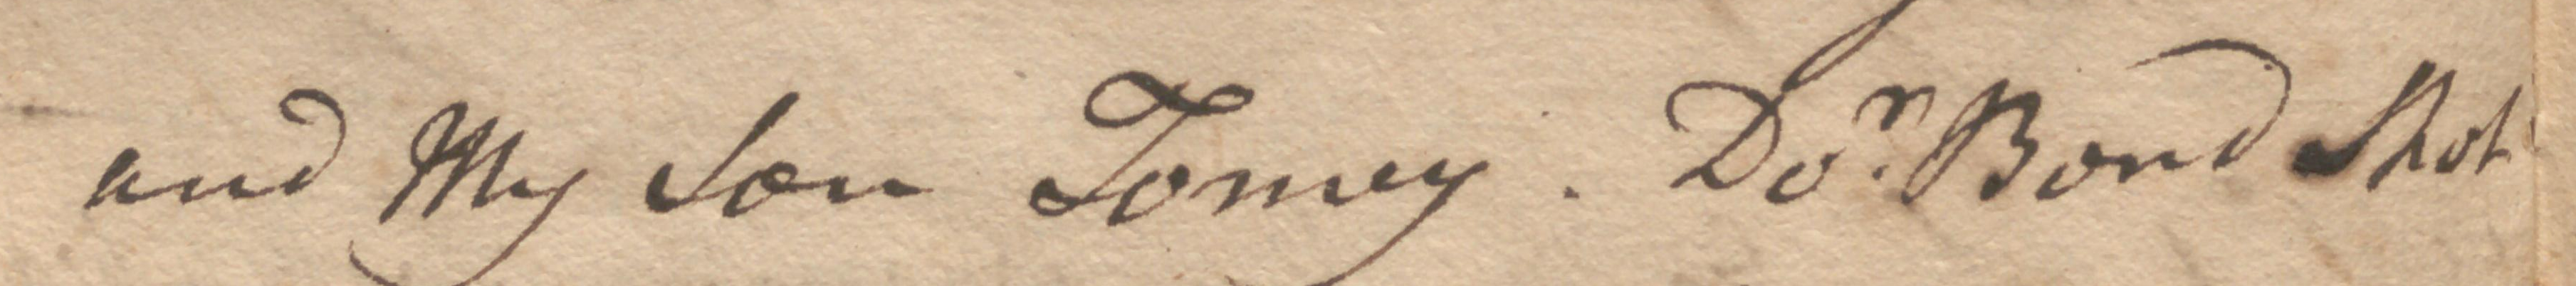and My Son Tomey. Do^r. Bond Shot
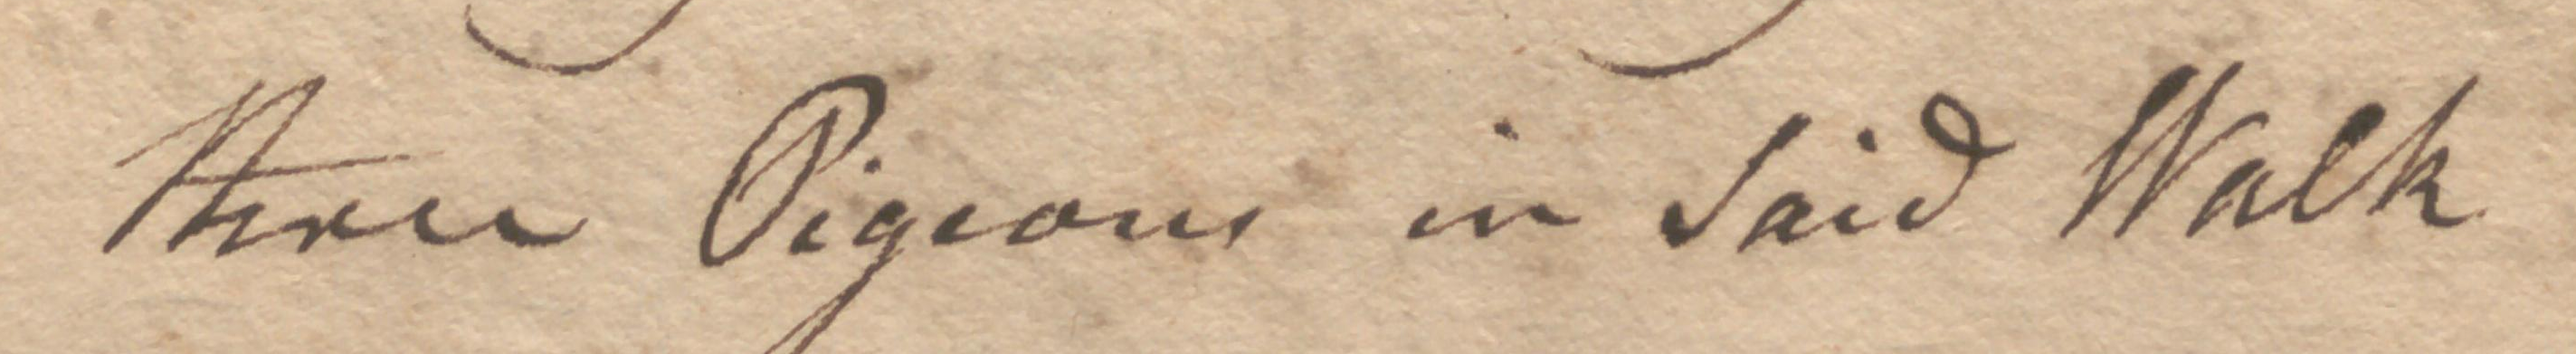three Pigeons in said Walk
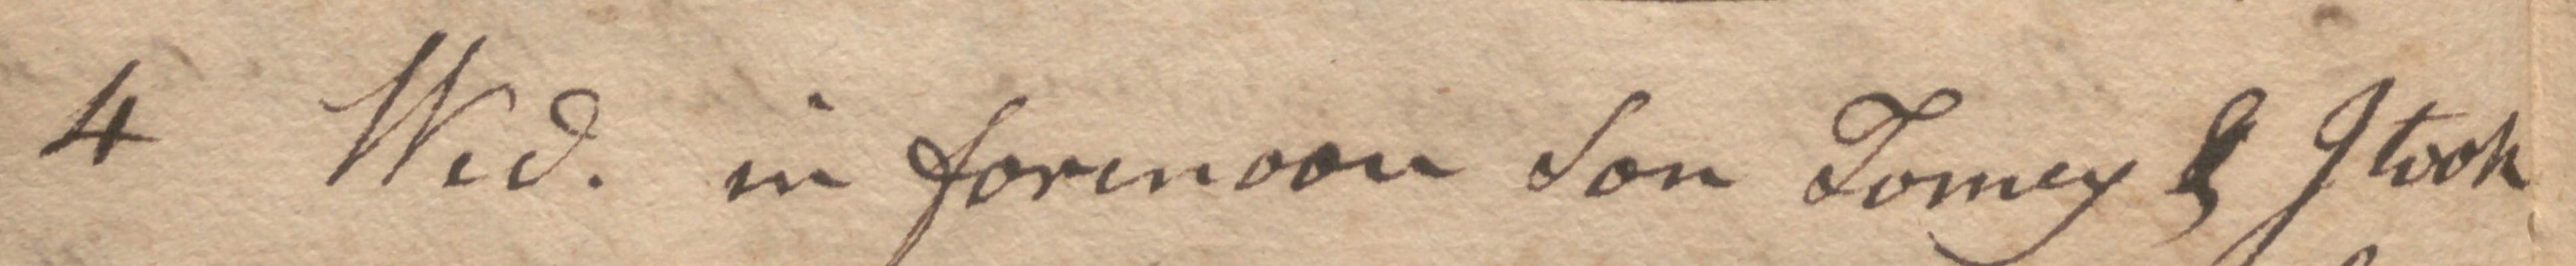4 Wed. in forenoon Son Tomey & I took
